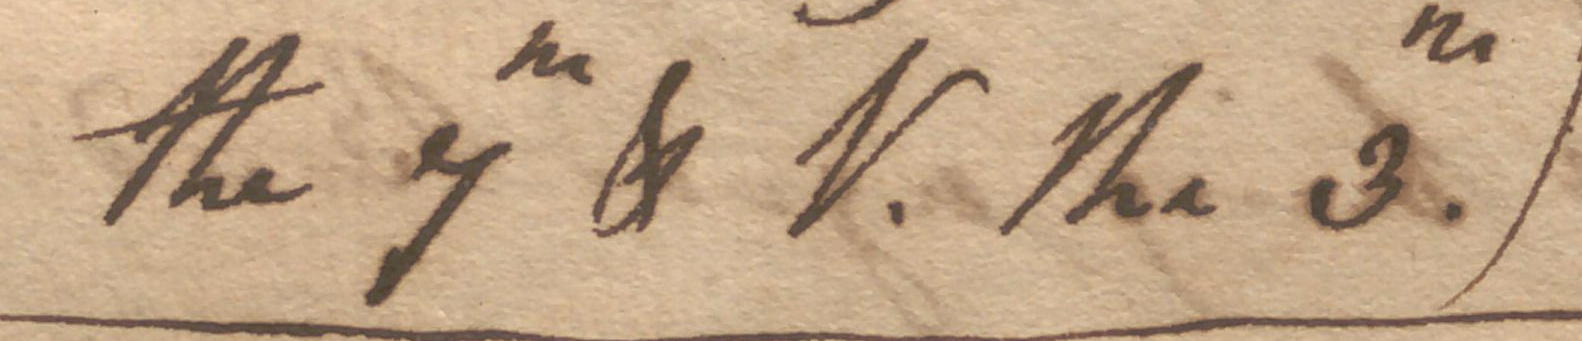the 7^th & V. the 3^th.
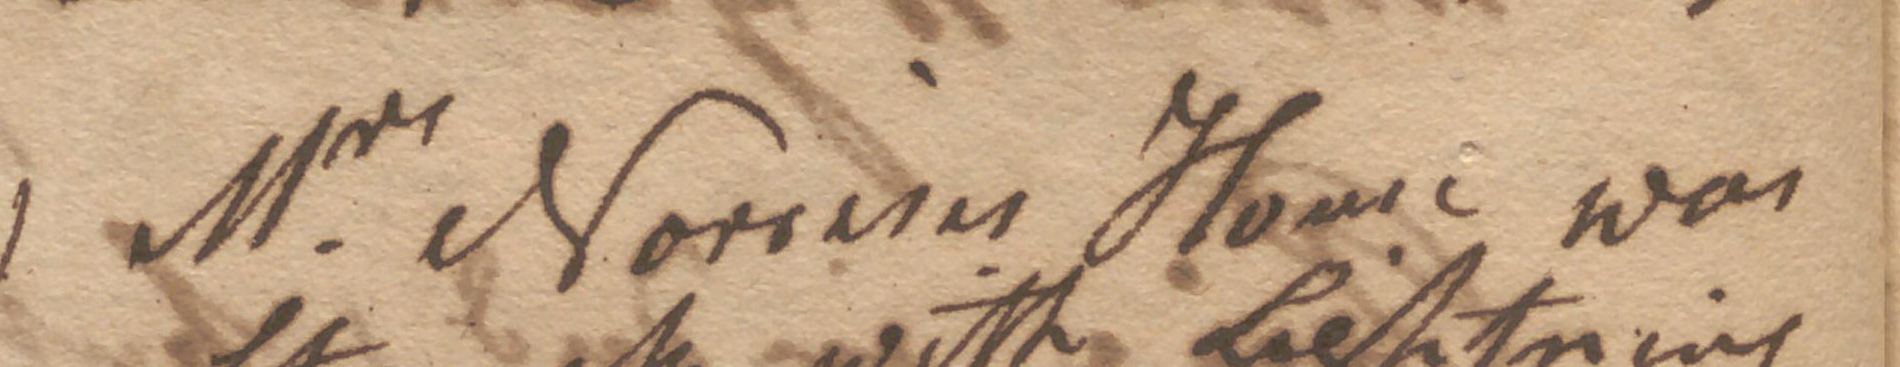M^rs. Norrises House was
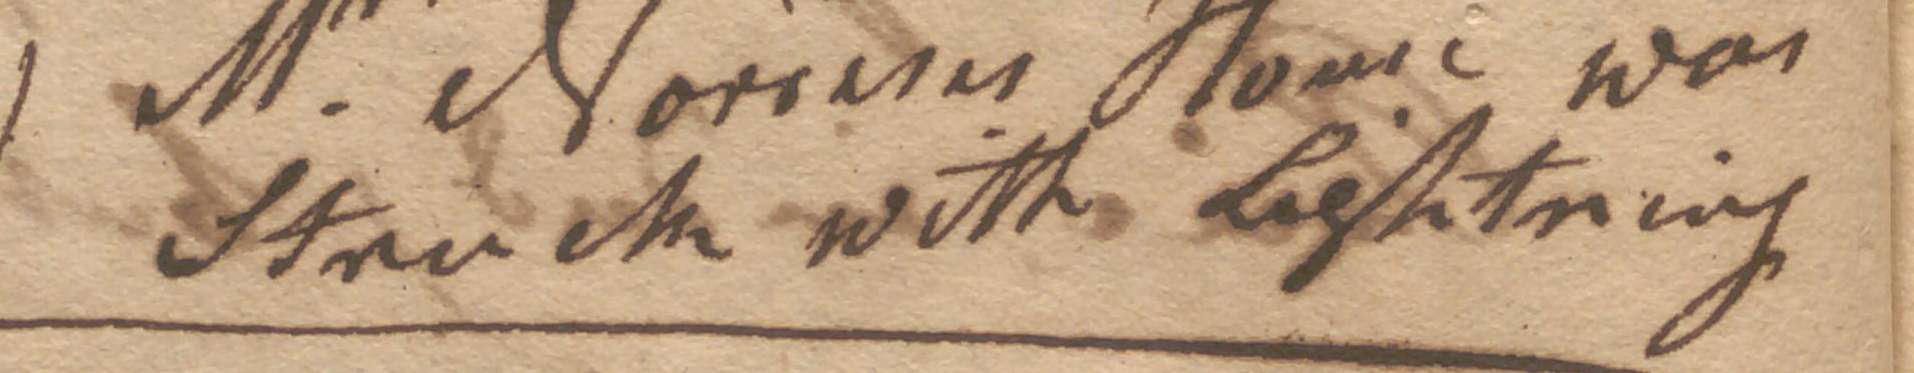Struck with Lightning
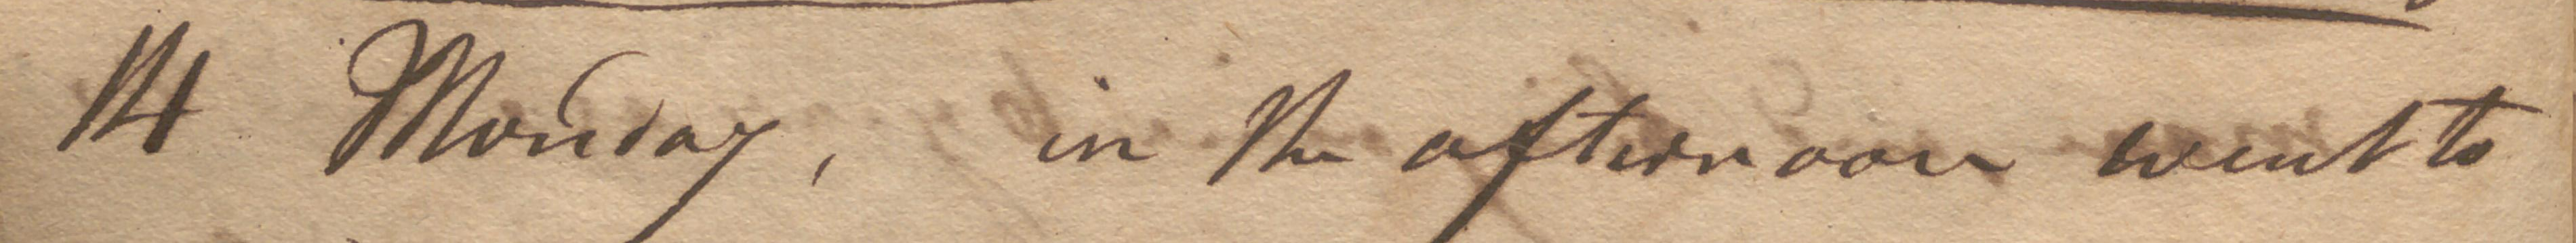14 Monday, in the afternoon went to
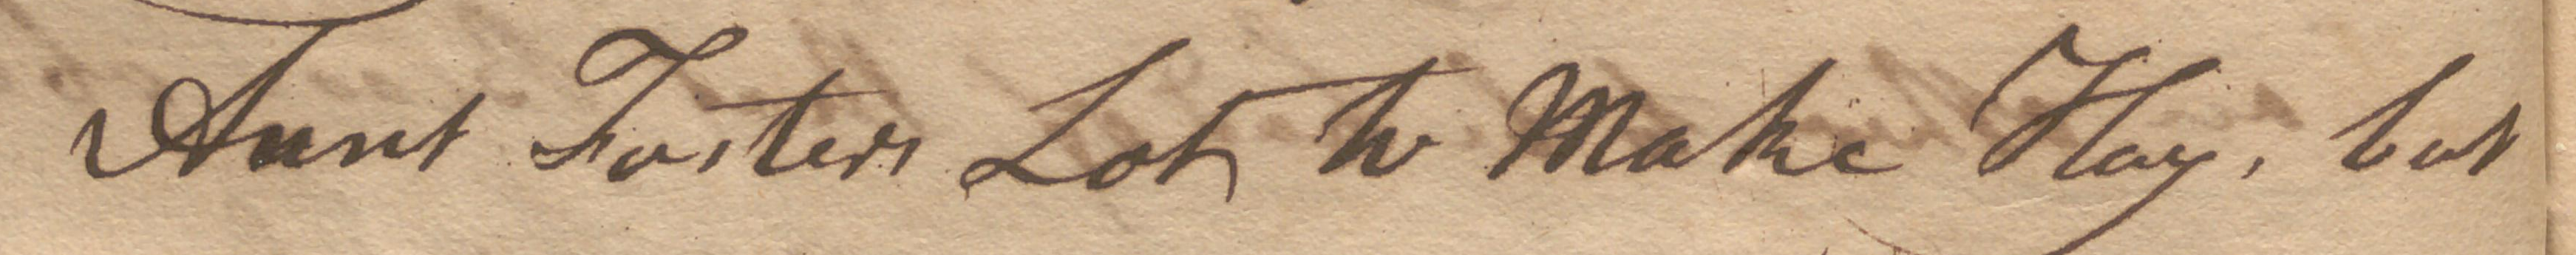Aunt Fosters Lot to Make Hay, but
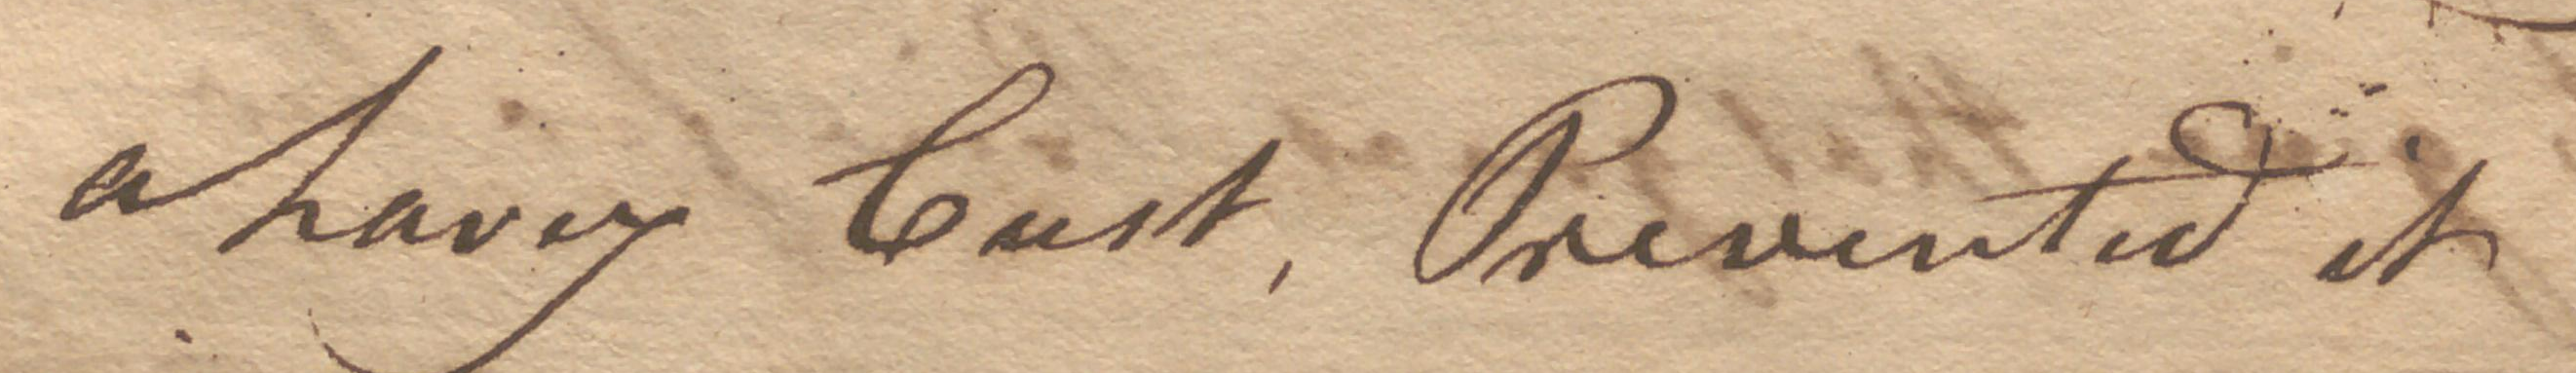a havey Cust, Prevented it
